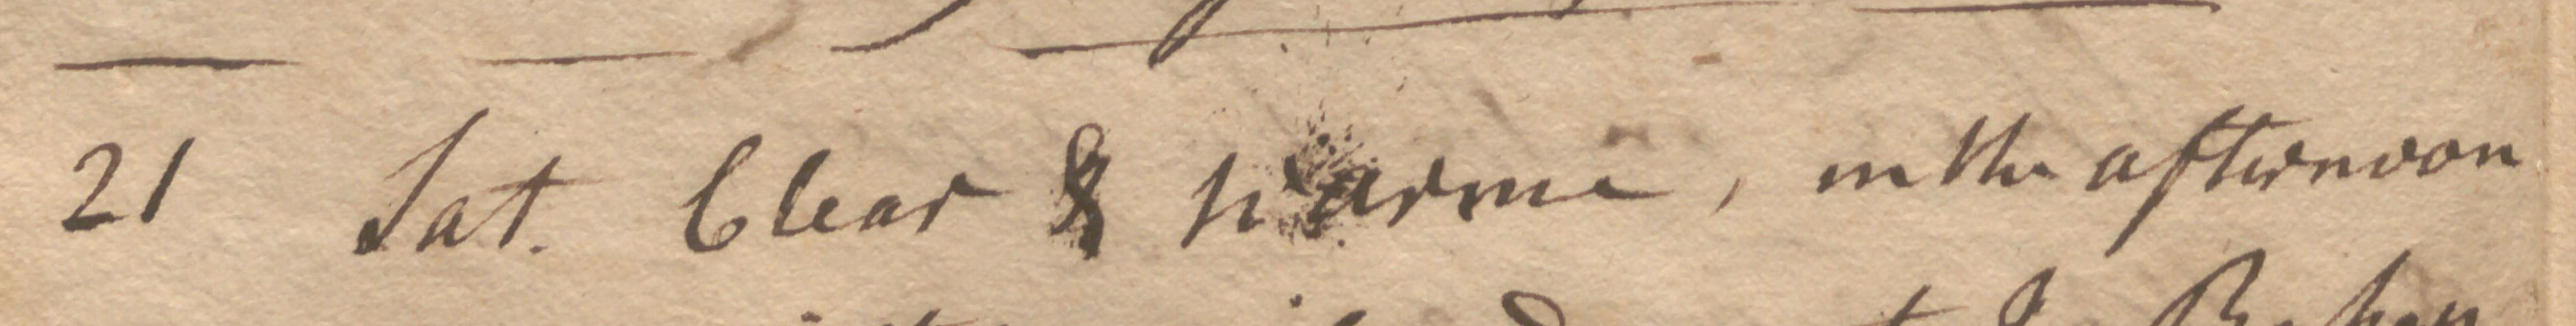21 Sat. Clear & warme, in the afternoon
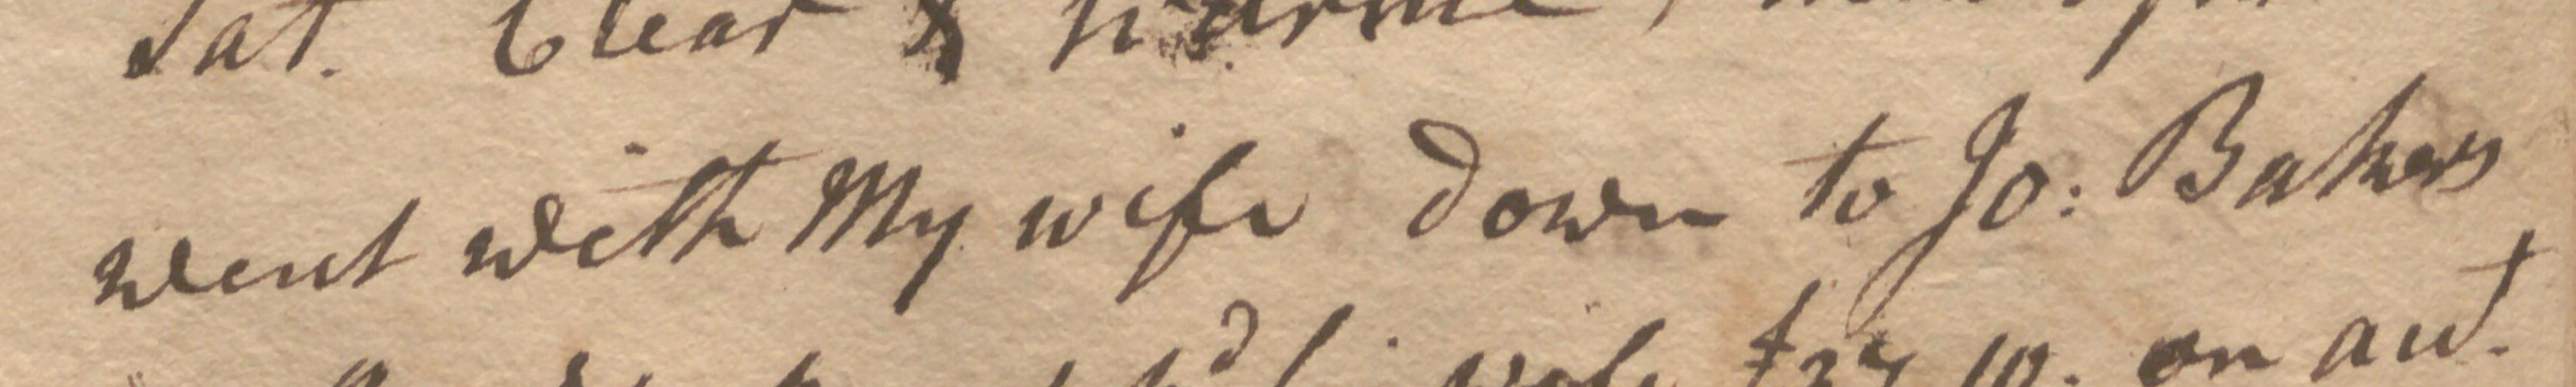went with My wife down to Jo. Bakers
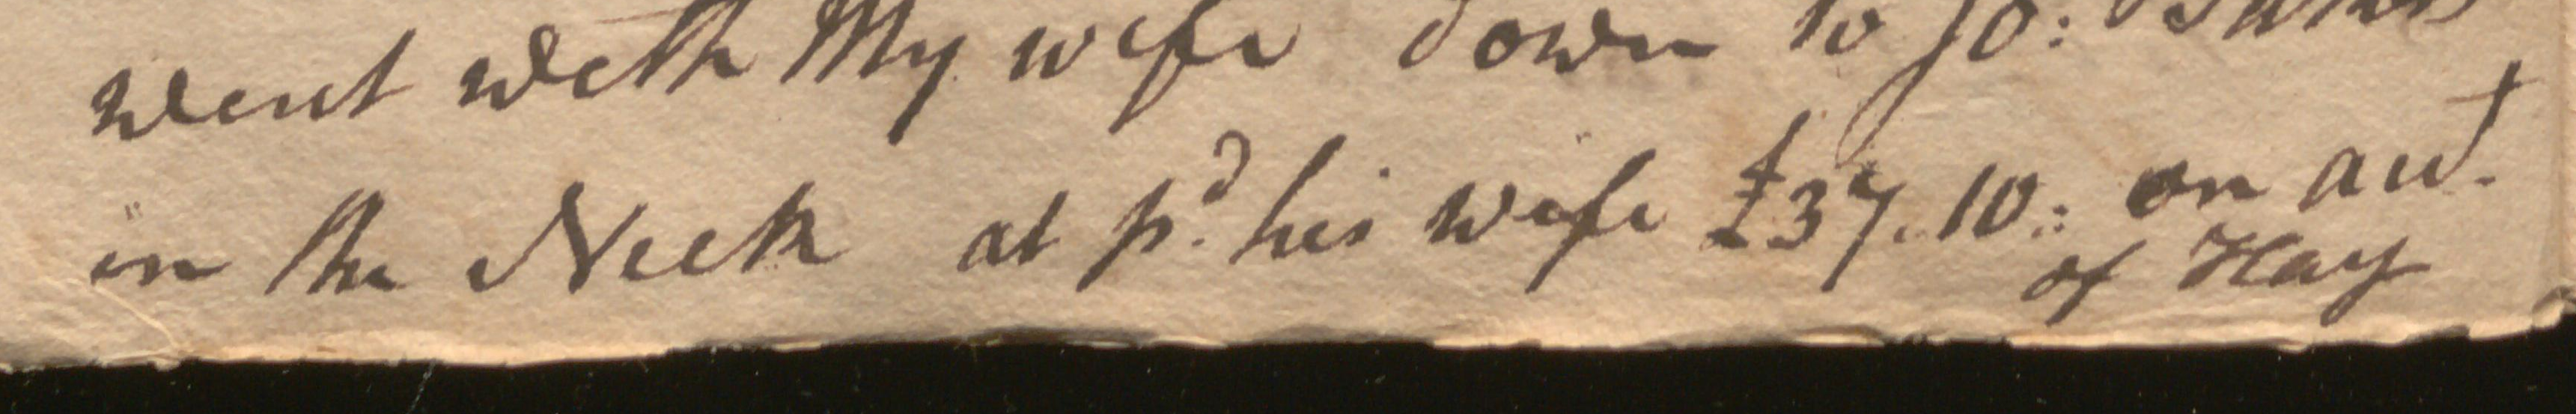in the Niek at p^d. his wife £37.10. on acc^t.
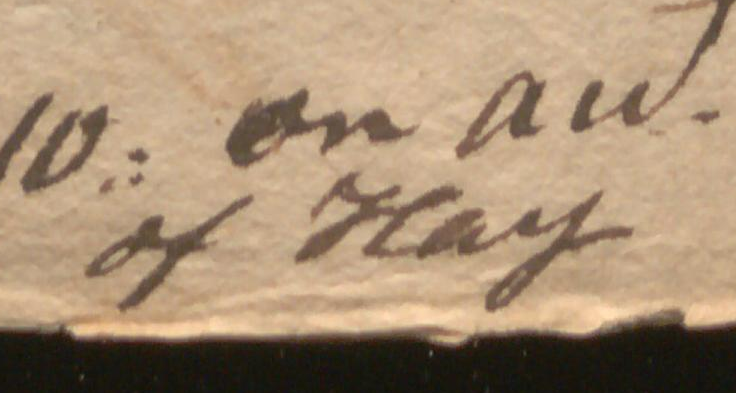of Hay
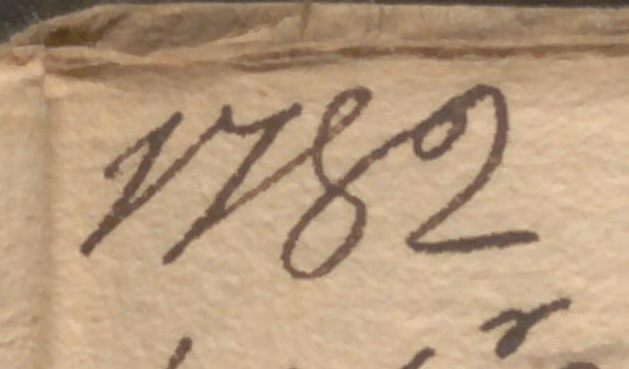1782
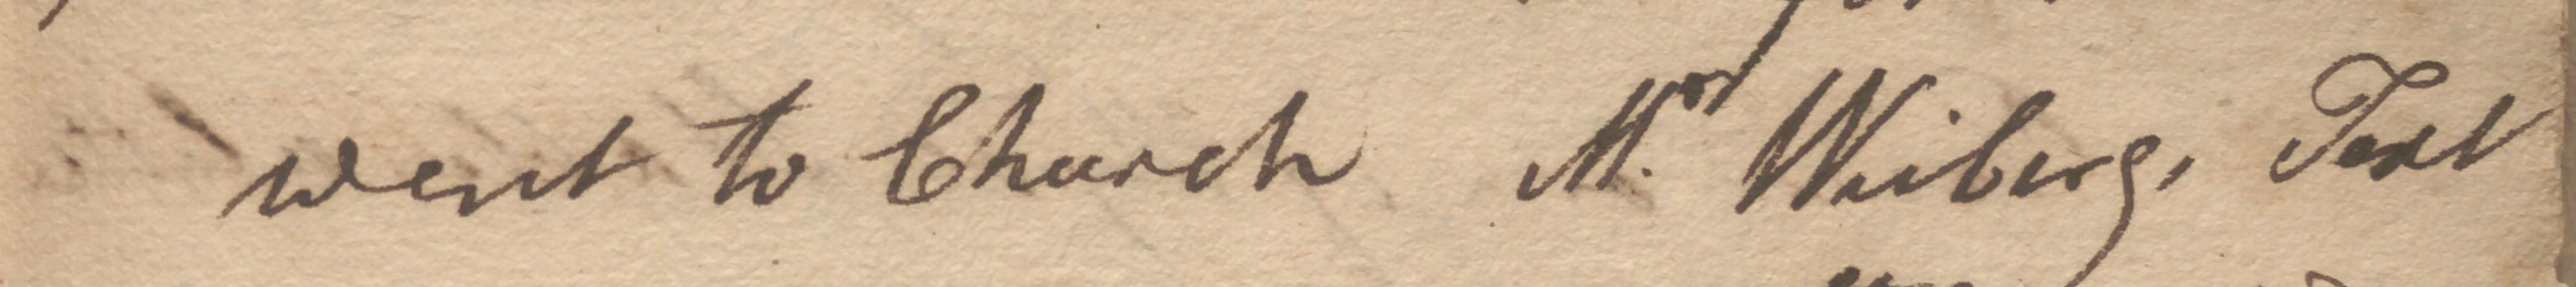went to Church M^r. Weibergs Text
